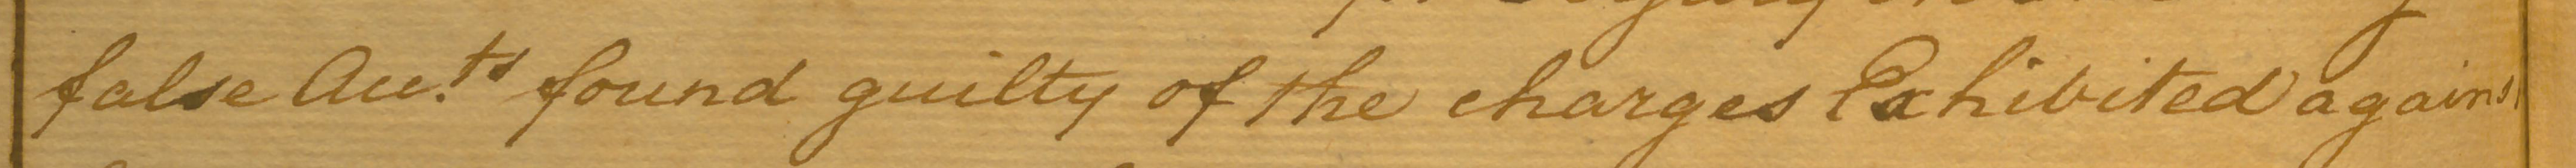false Acc^ts. found guilty of the charges Exhibited against
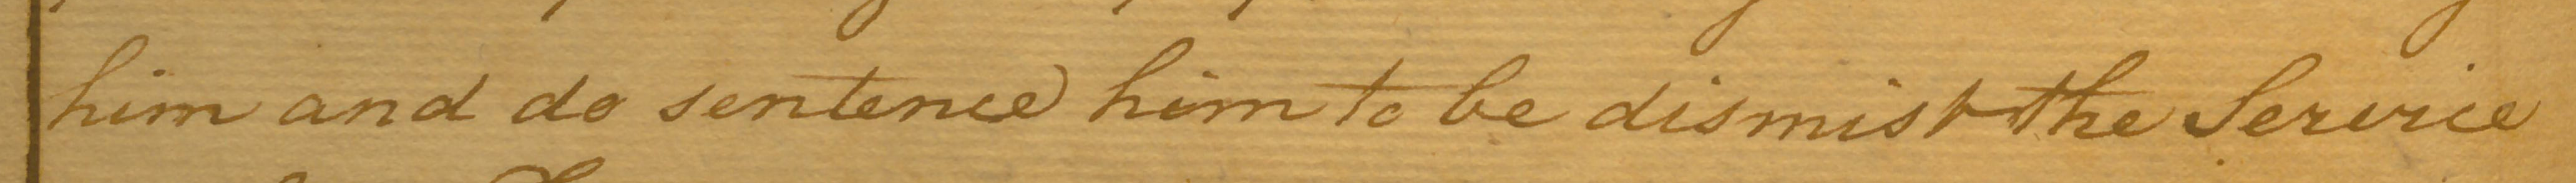him and do sentence him to be dismist the Service
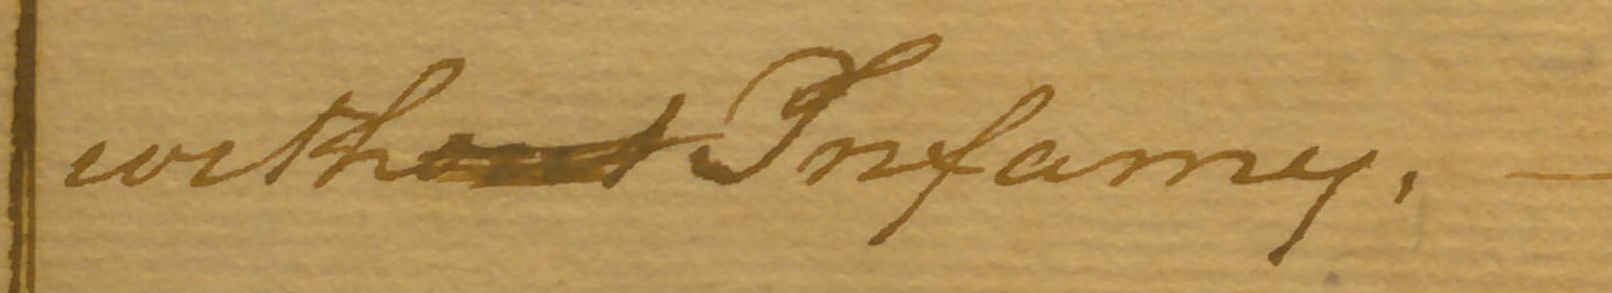with[out] Infamy.
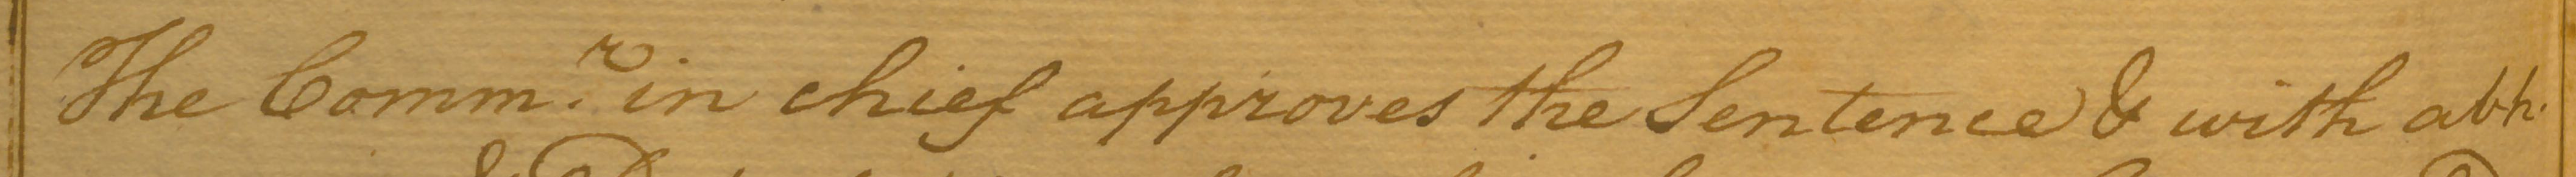The Comm^r. in chief approves the Sentence & with abh-
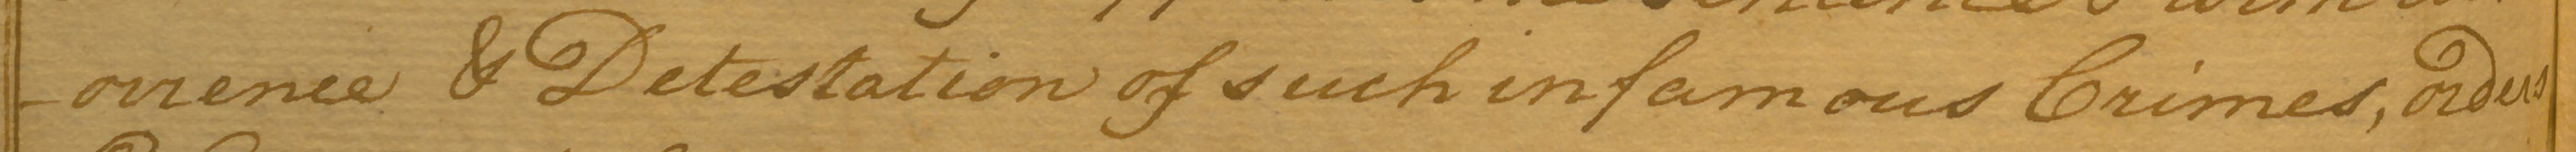-orence & Detestation of such infamous Crimes, orders
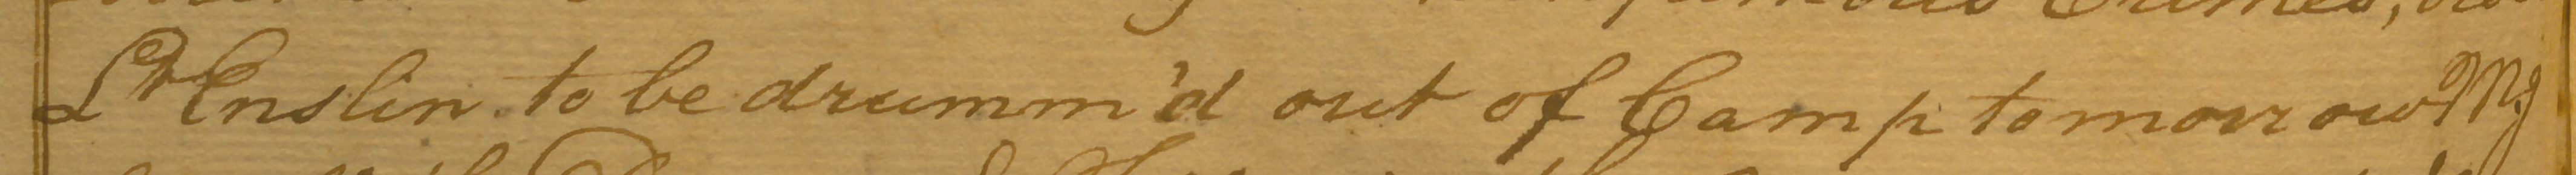L^t. Enslin to be drumm'd out of Camp tomorrow M^g.
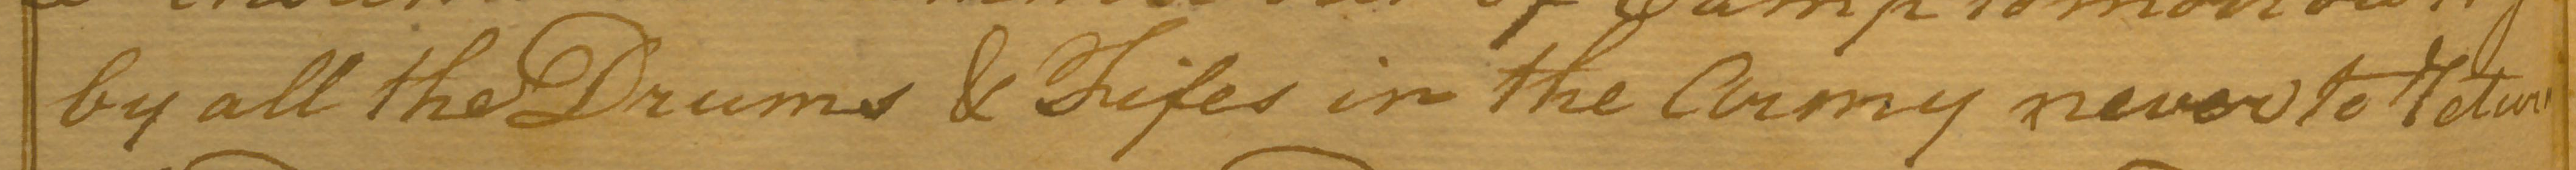by all the Drums & Fifes in the Army never to return
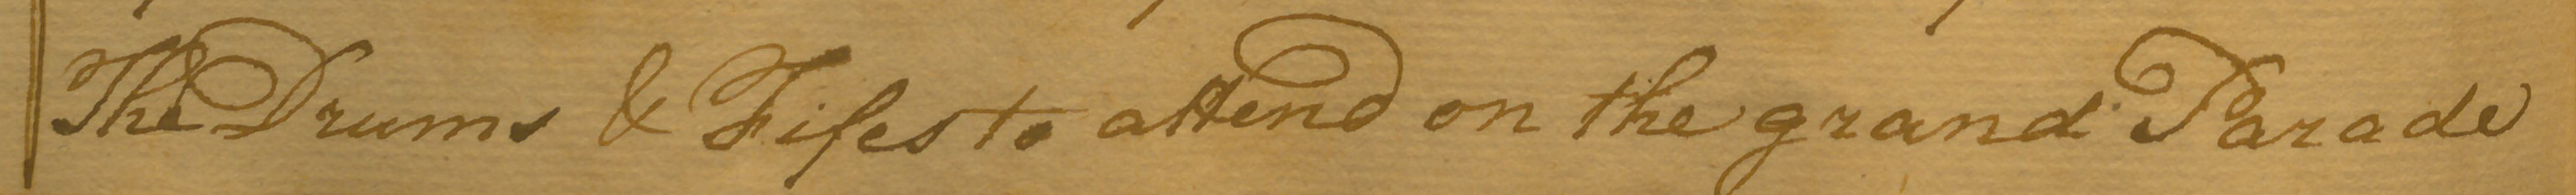The Drums & Fifes to attend on the grand Parade
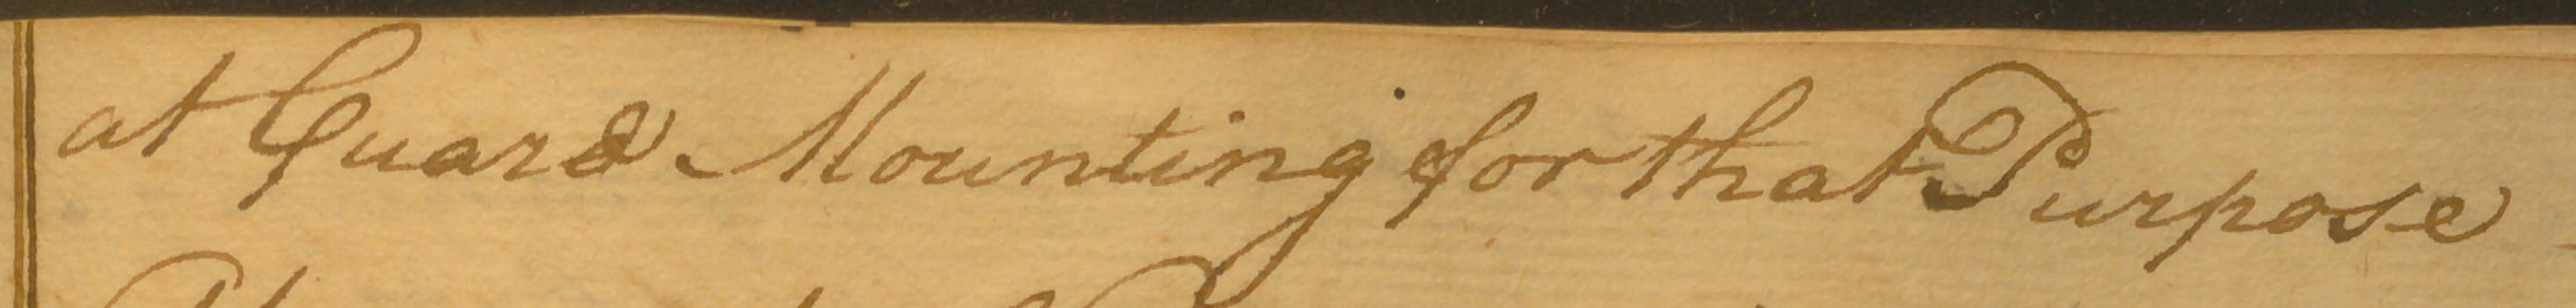at Guard Mounting for that Purpose
